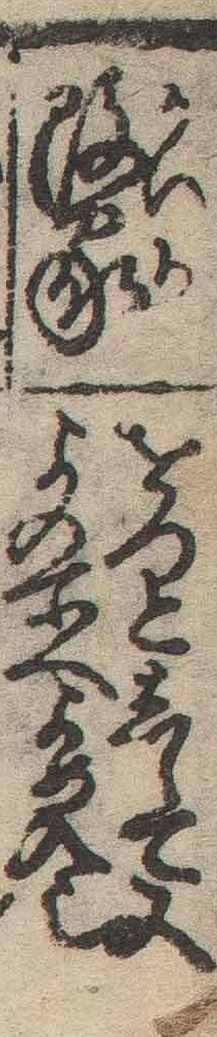よの所へよめ入也
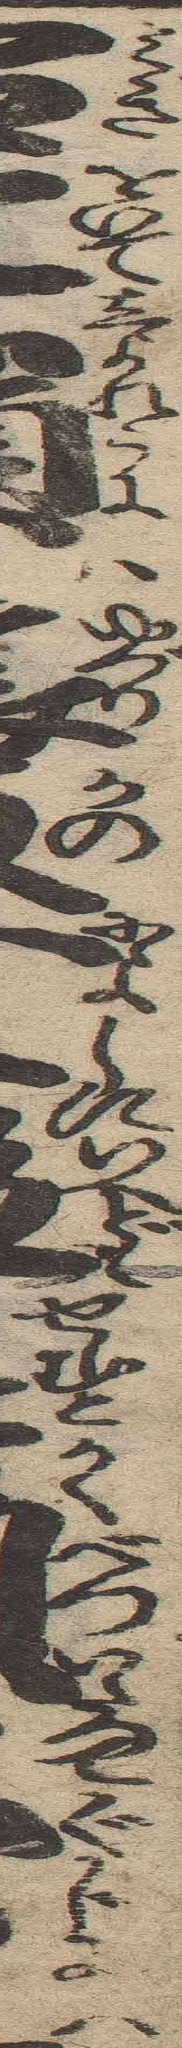みぎをいてしよれうにはゆづりかのによしにいへどもせしむかくべついたつてぐじには
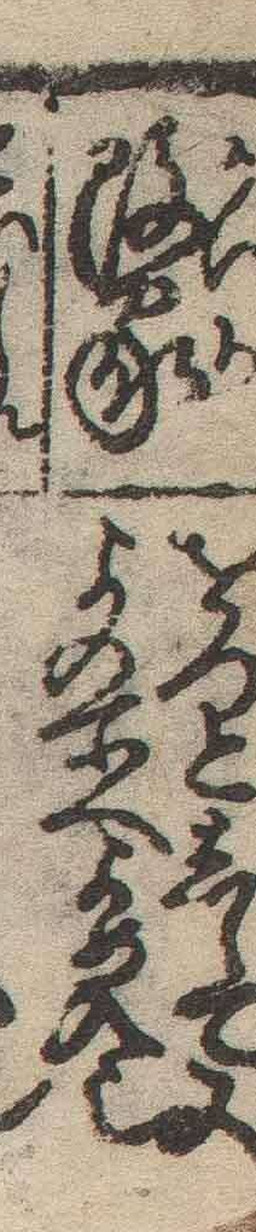よの所へよめ入也
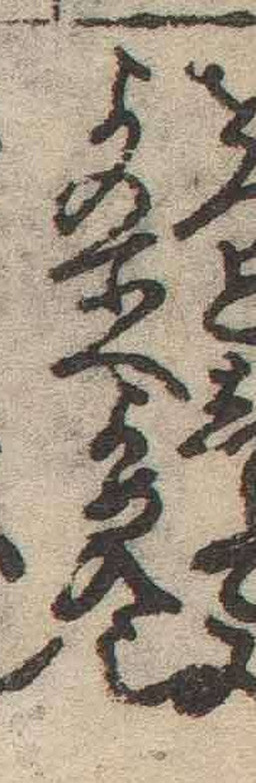よの所へよめ入也
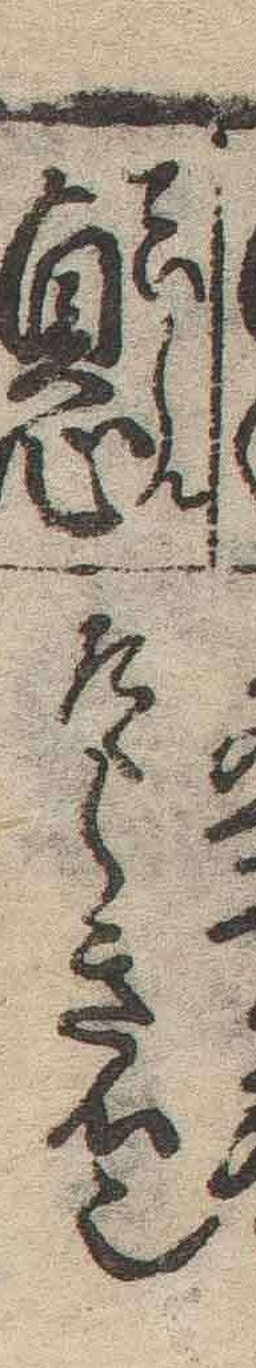貞心たゝしき心也
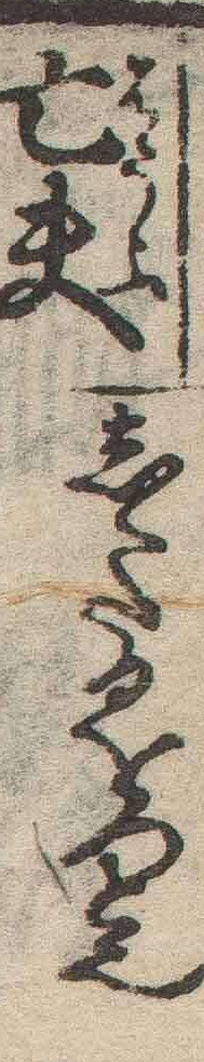亡夫しゝたるをつと也
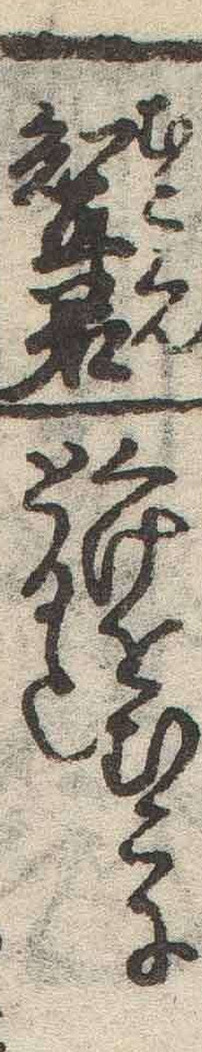聟君くけをむこに
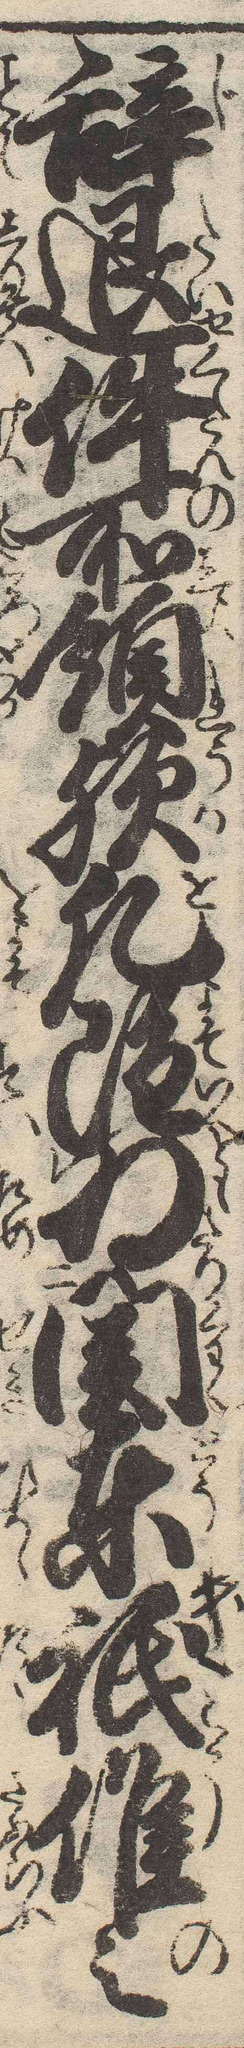辞退件所領欤凡雖為関東祗候之
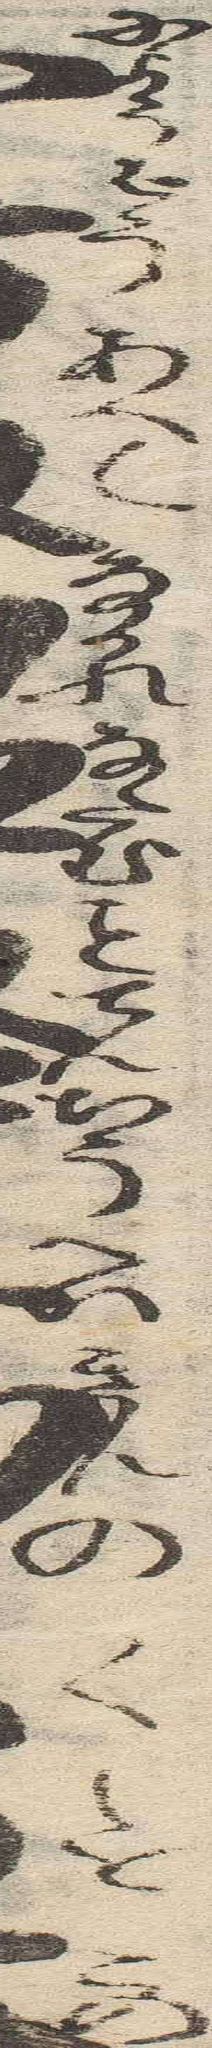にようばうあへてなかれなたむことてんちうへいきんのくしをこの
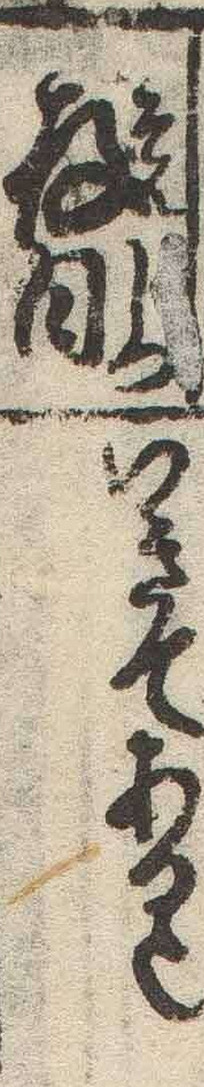存日いきてある也
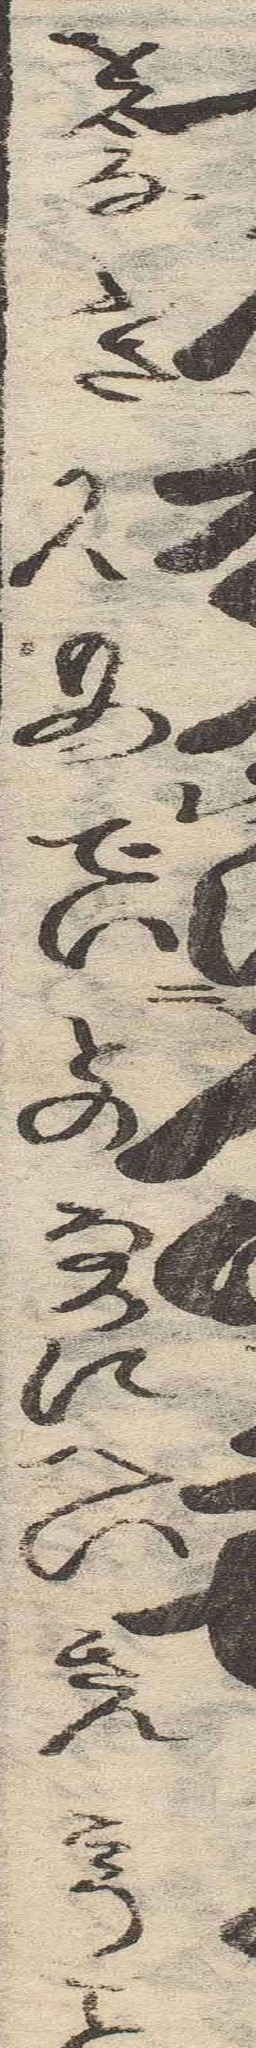をんなふさかんものでいとのなかにへいきんこうことし
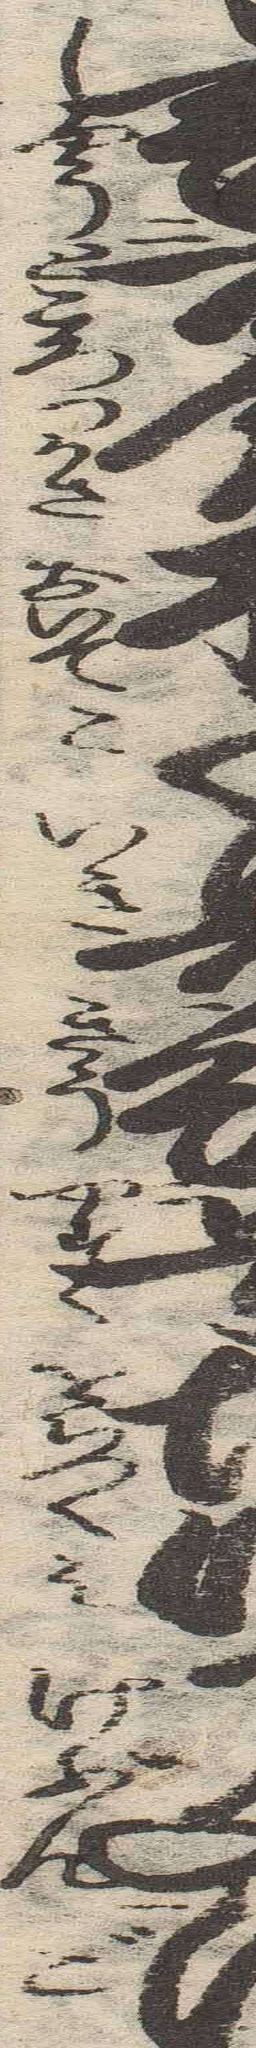しやうところつかさおいてこいききうやすくをちつくこげぶんご
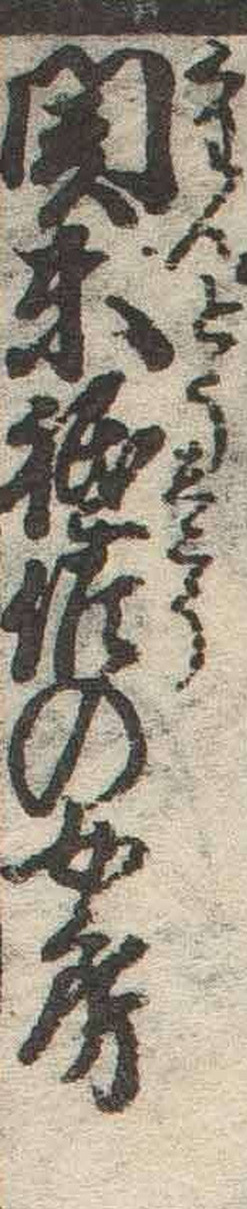関東祗候の女房
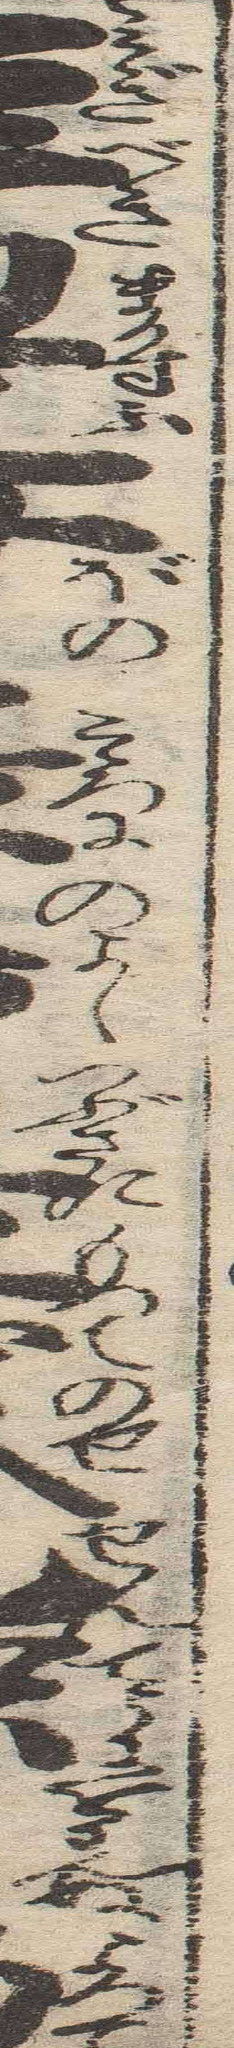みぎべきまかすふぼのこゝろにのよしつぶさにもつてのせせんてうにをわんぬよつて
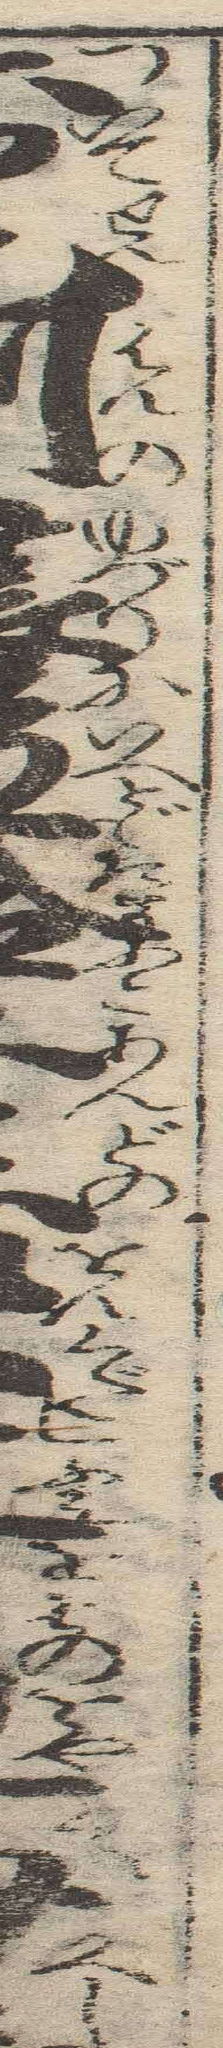ついてせんはんのゆづりにいへどもたまふとあんどのをんくだしふみをそのをやくいかへしすを
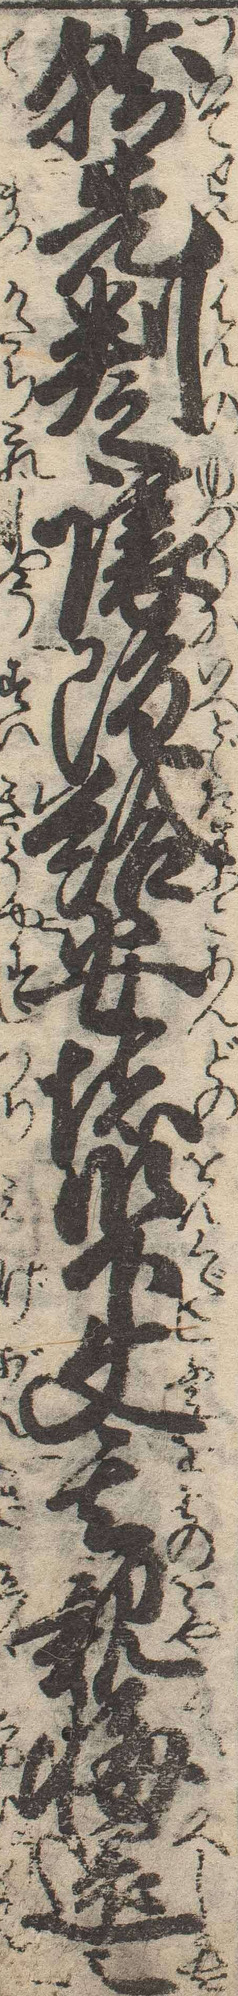就先判之譲雖給安堵御下文其親悔返之
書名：御成敗式目絵抄
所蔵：東京学芸大学附属図書館 国文学研究資料館
